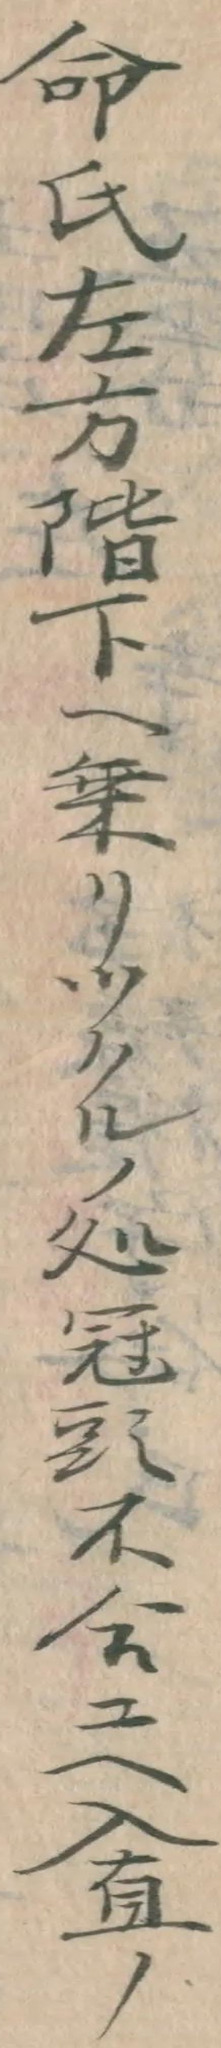命氏左方階下へ乗リツクルノ処冠頭不合ユヘ入直ノ
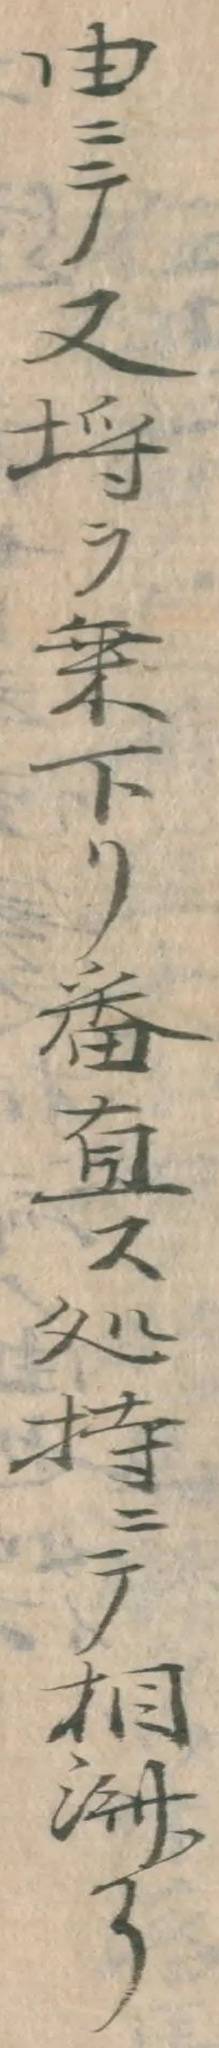由ニテ又埒ヲ乗下リ番直ス処持ニテ相済了
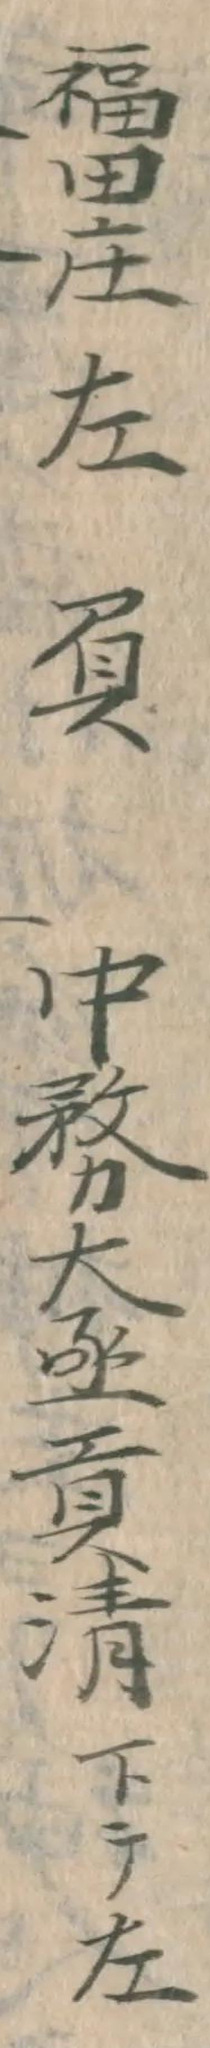福田庄左負中務大丞貢清下テ左
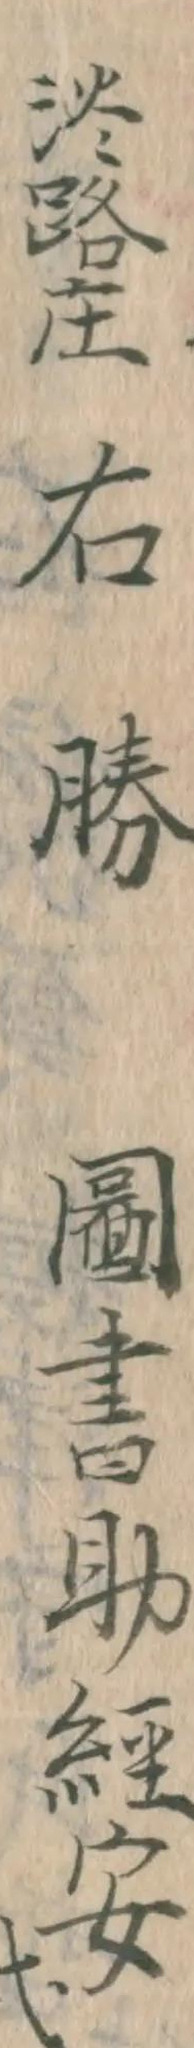淡路庄右勝図書助経安
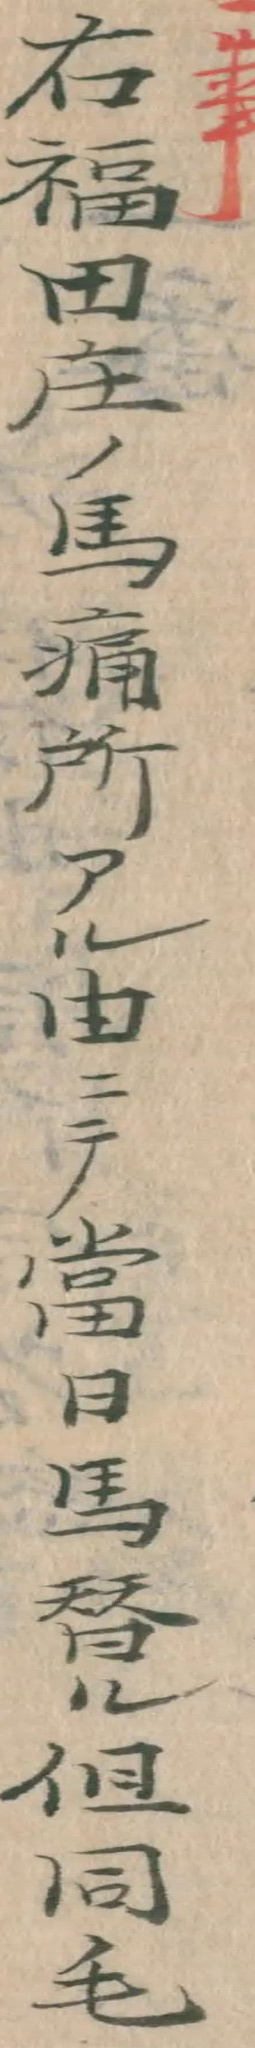右福田庄ノ馬痛所アル由ニテ当日馬替ル但同毛
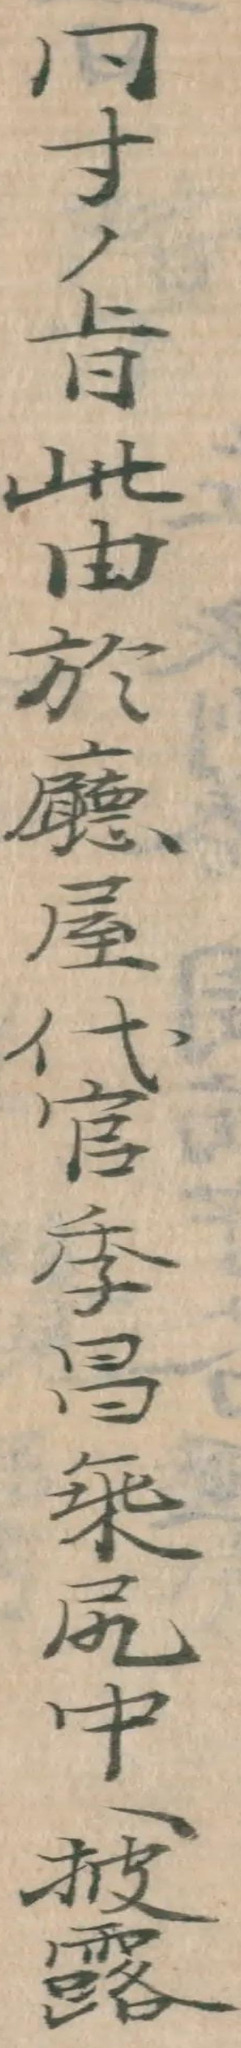同寸ノ旨此由於庁屋代官季昌乗尻中ヘ披露
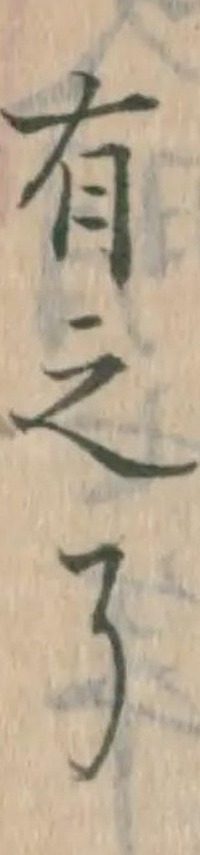有之了
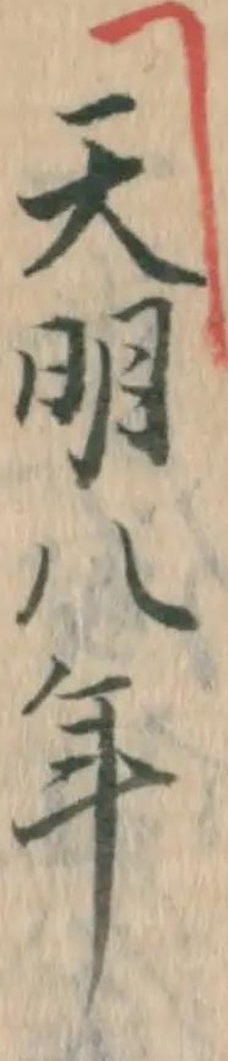天明八年
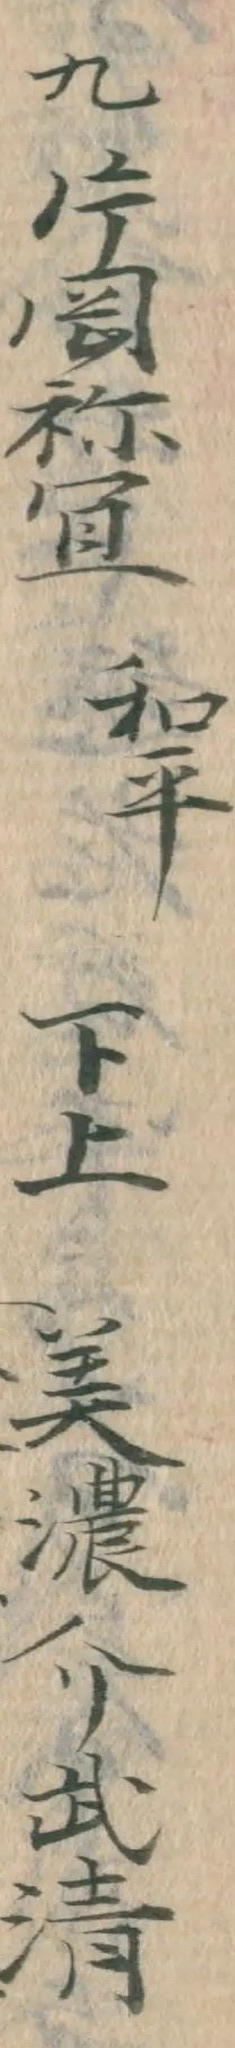九片岡祢宜和平下上美濃介武清
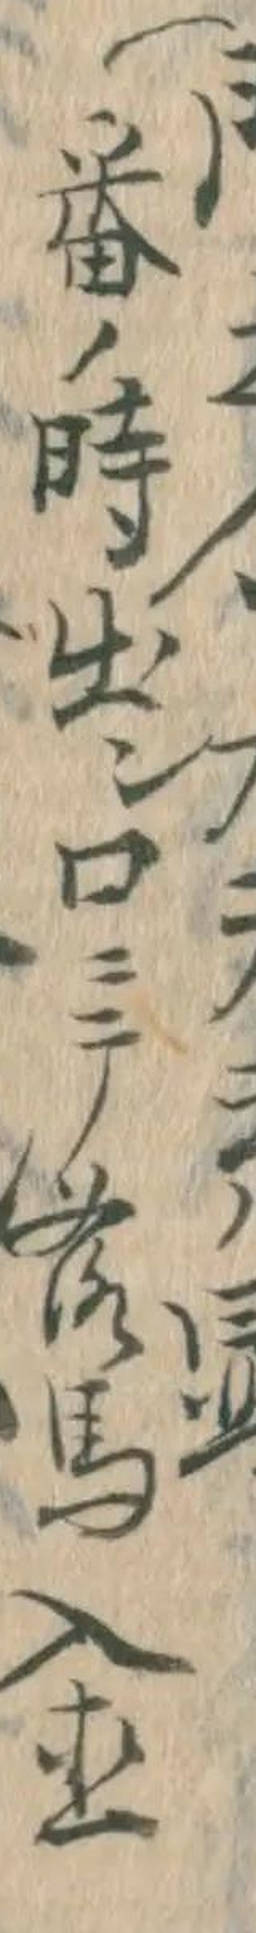(番ノ時出シ口ニテ落馬入直
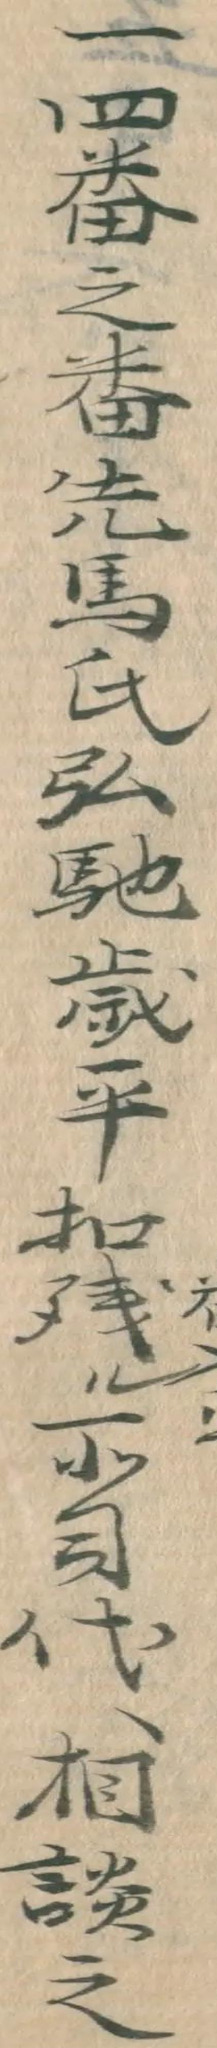一四番之番先馬氏弘馳歳平扣残ル所司代へ相談之
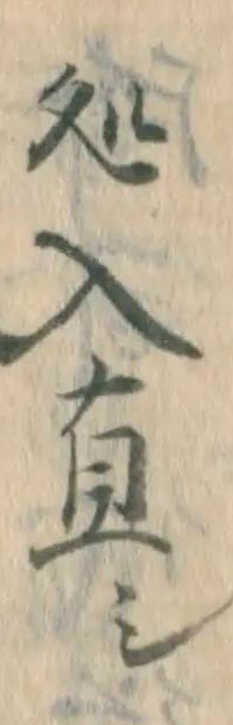処入直シ
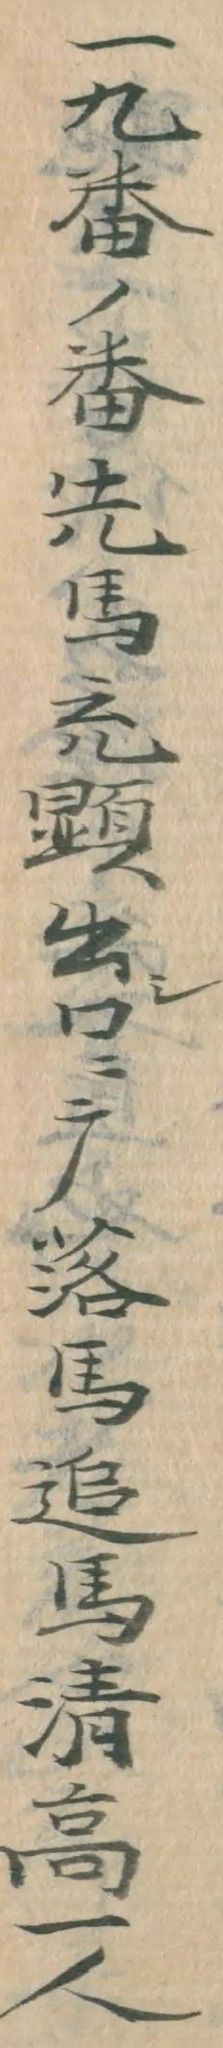一九番ノ番先馬充顕出シ口ニテ落馬追馬清高一人

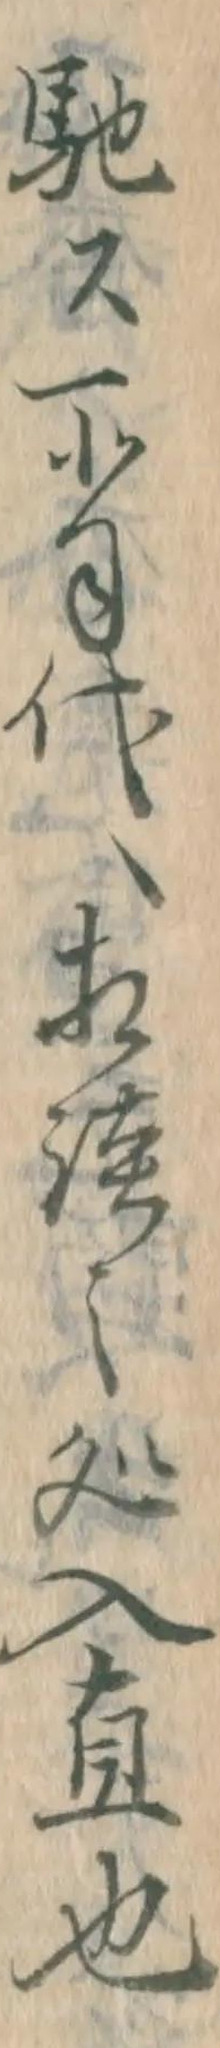馳ス所司代へ相談之処入直也
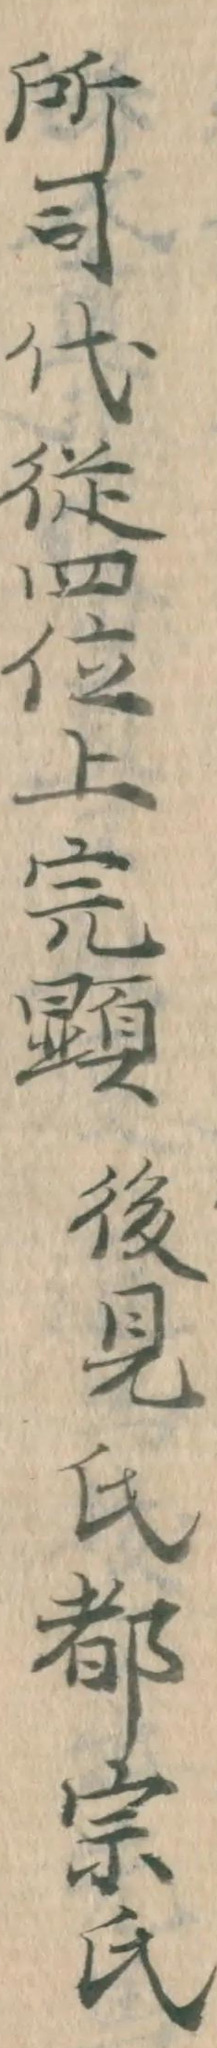所司代従四位上完顕後見氏都宗氏
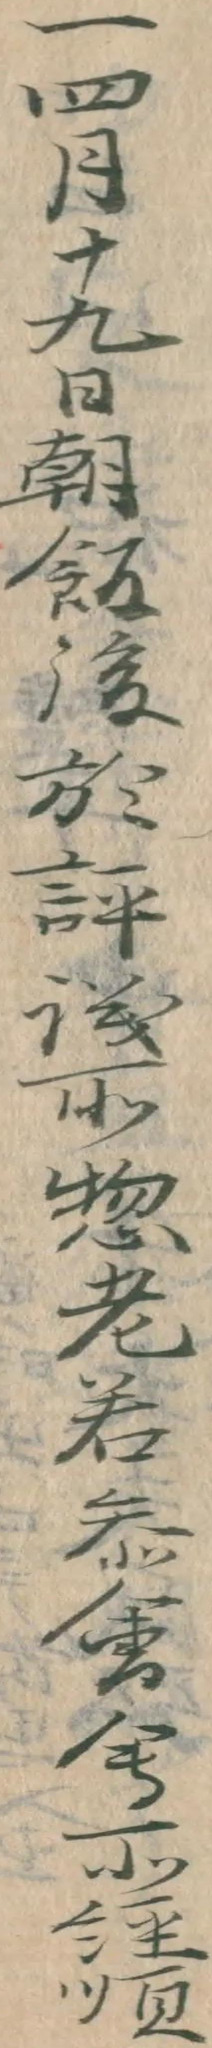一四月十九日朝飯後於評議所惣老若参会会所経順
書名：賀茂社記録. 第10冊
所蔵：国立国会図書館 National Diet Library, JAPAN
